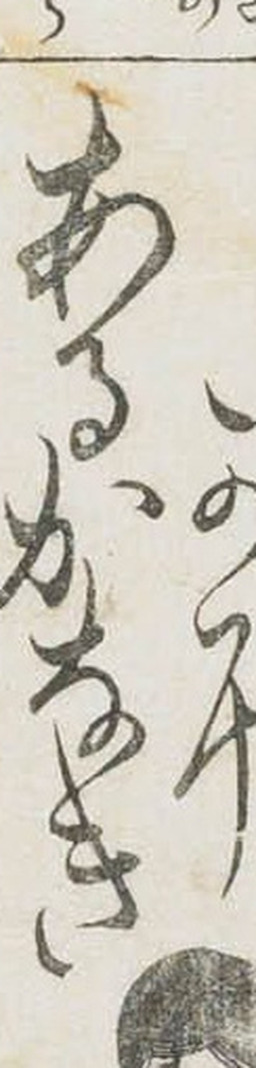あるかなき
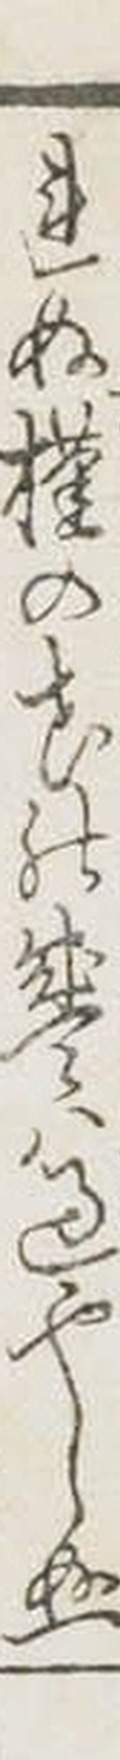れぬ槿の花の盛は過やしぬ
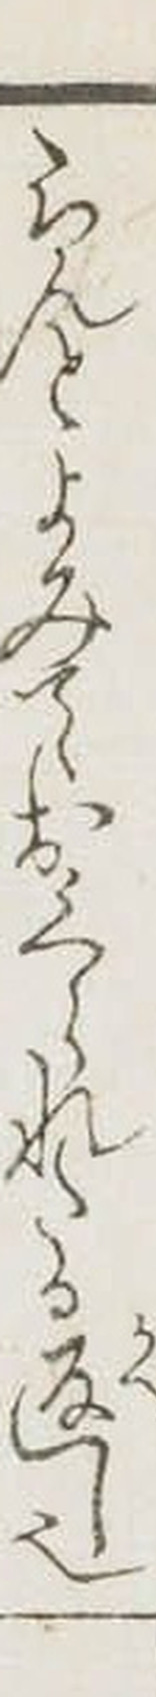らんとよみておくられたる返し也
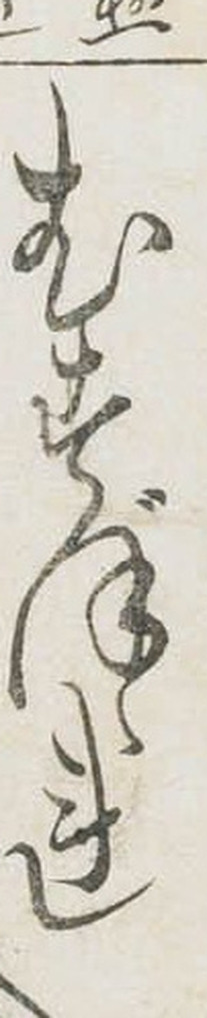むすぼゝれ
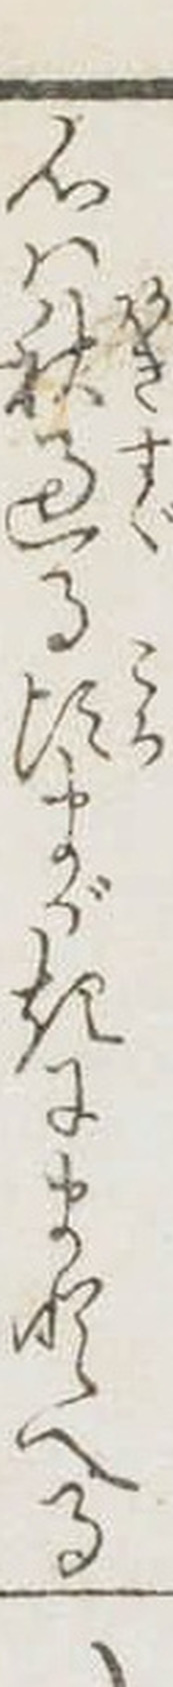心は秋過る頃まがきにまとへる
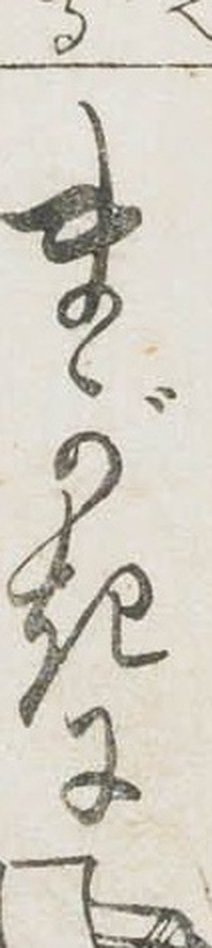まがきに
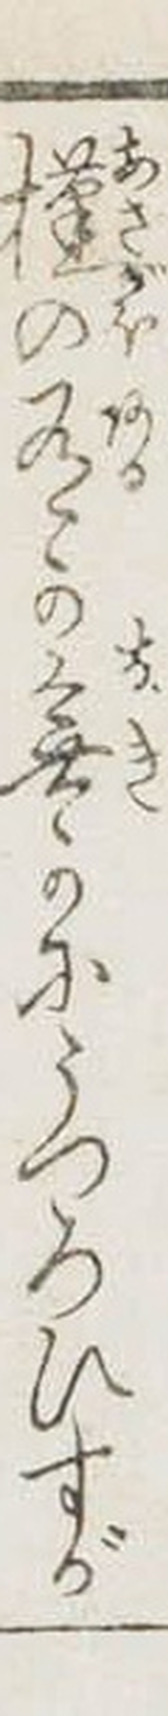槿の有か無かにうつろひすが
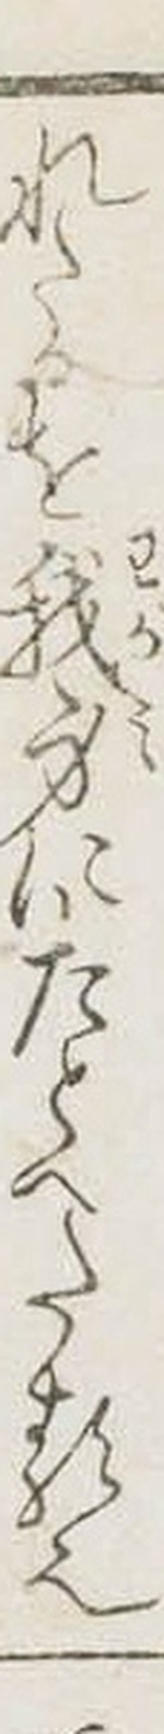れたるを我身にたとへたる也
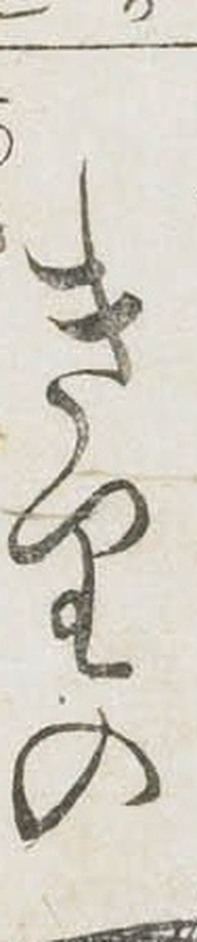きりの
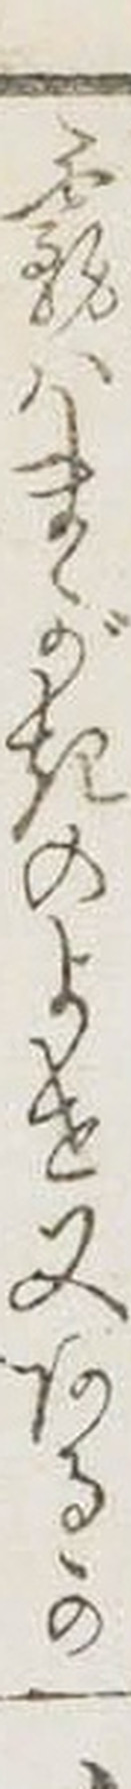霧はまがきのよせ又あるか
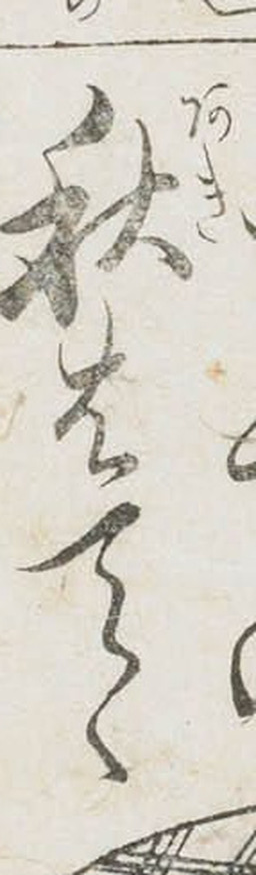秋はてゝ
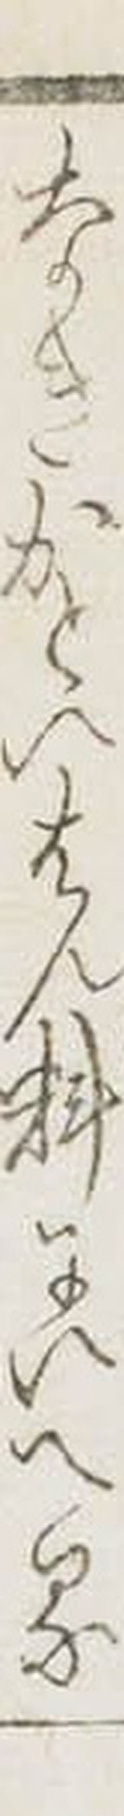なきかといはん料にいへる
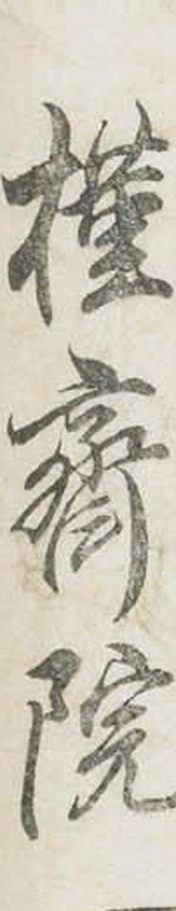槿斎院
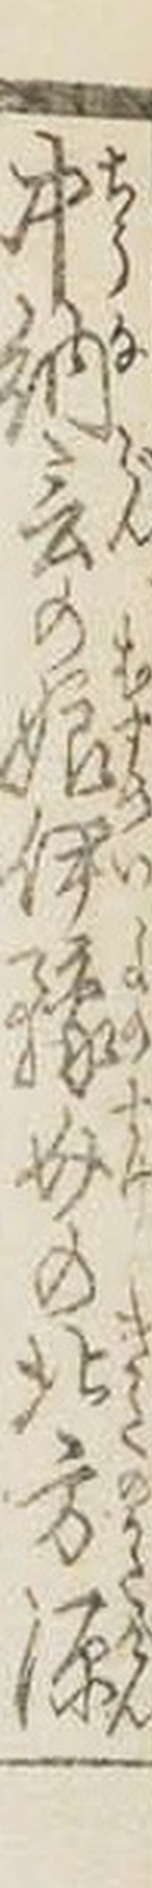中納言の娘伊予介の北方源
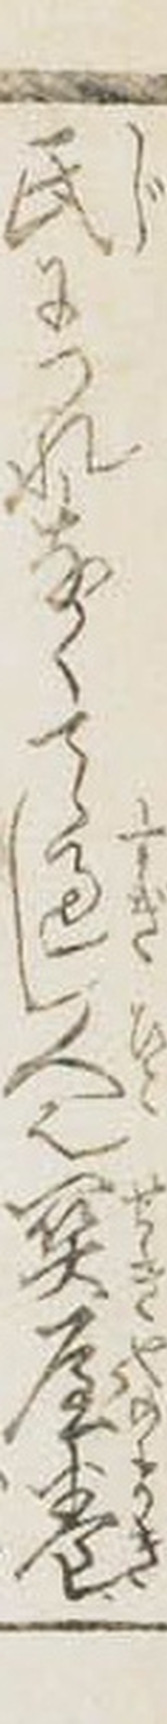氏につれなくて過し人也関屋巻
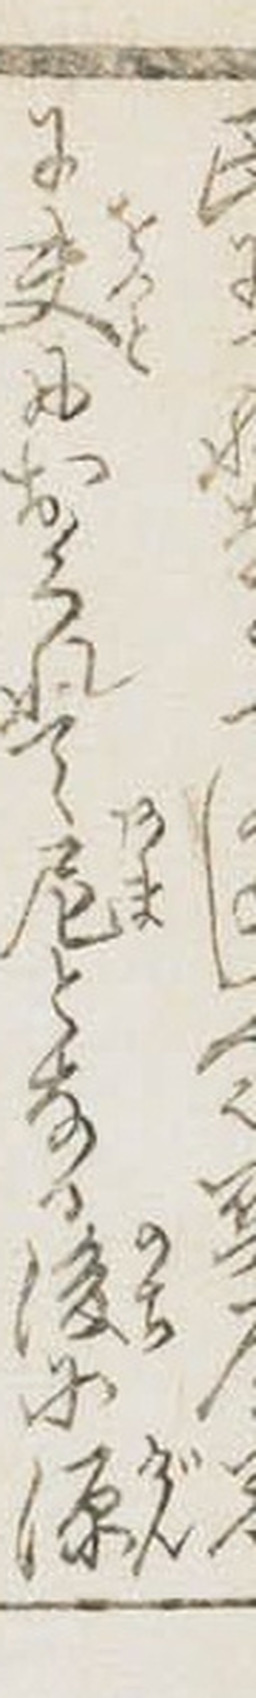に夫におくれて尼となる後に源
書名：源氏百人一首
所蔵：東京学芸大学教育コンテンツアーカイブ
